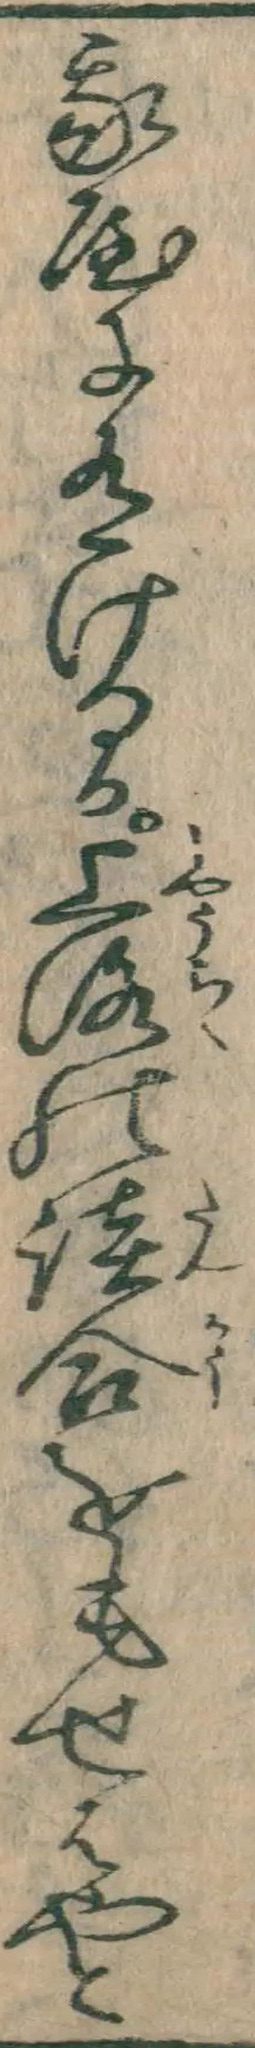我屋に有けるか。上洛の談合をもせはやと

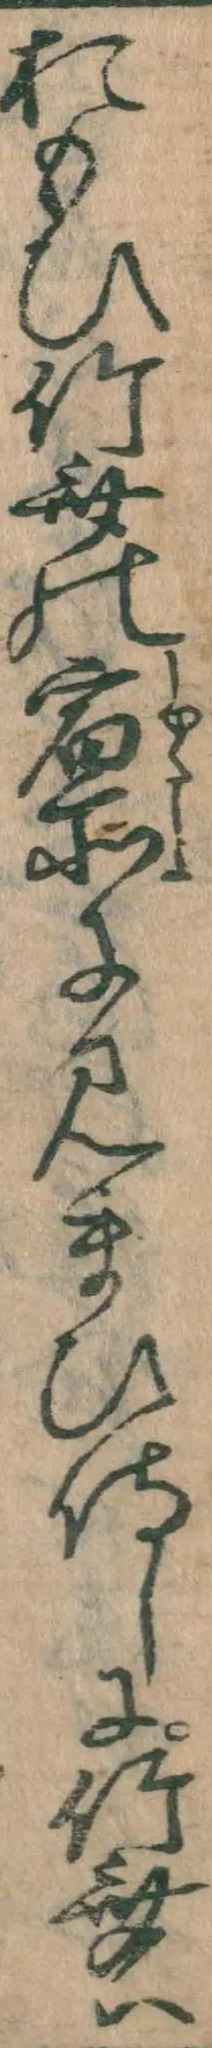おもひ竹斎の宿所に見まひ侍しに。竹斎は
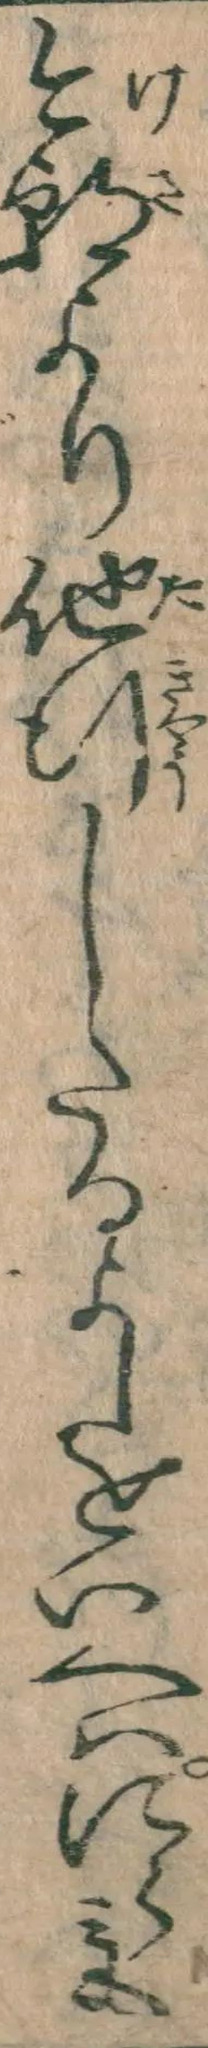今朝より他行したるよしをいへは。にらみ
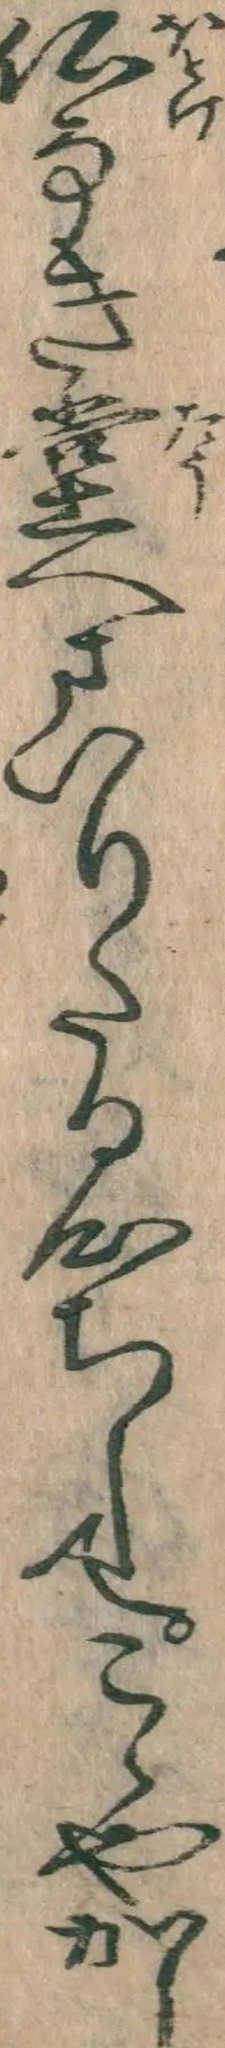仏なき堂へまいりたる心ちして。こゝやかし
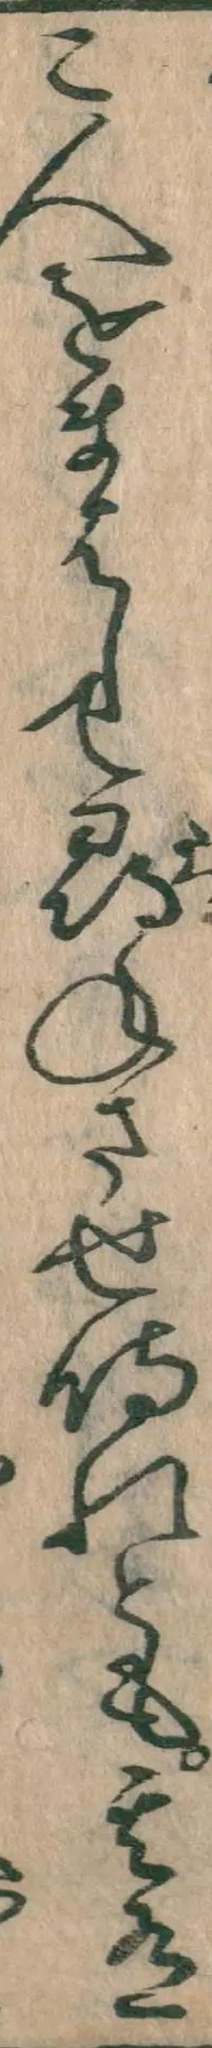こ人をまはして尋ねさせ侍れとも。其有
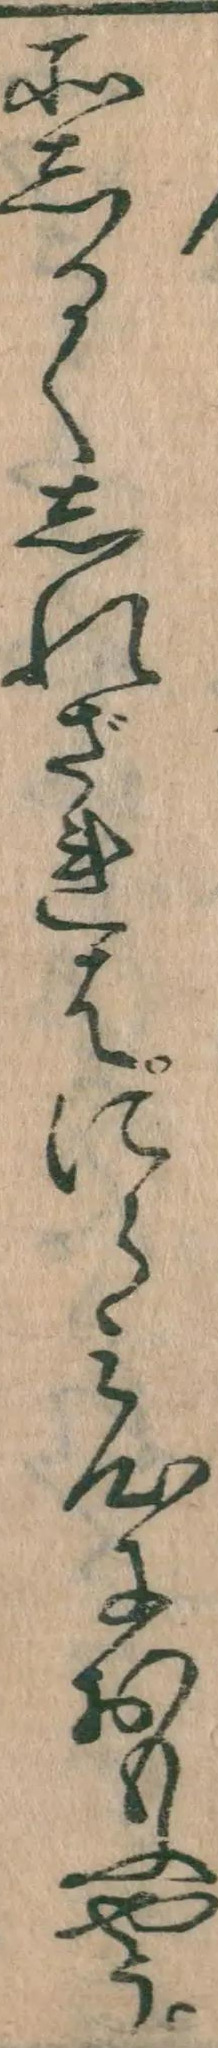所しるくしれざれは。にらみ心におもふやう。
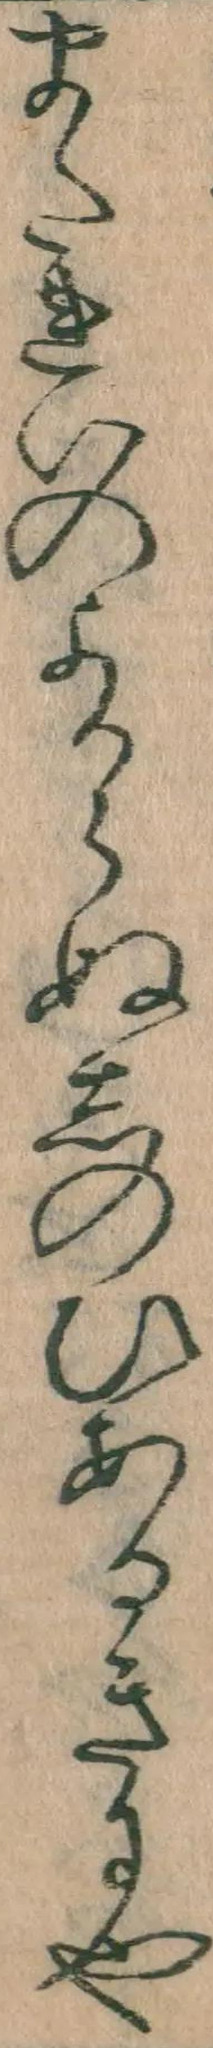またれいのよからぬしのひあるきにや
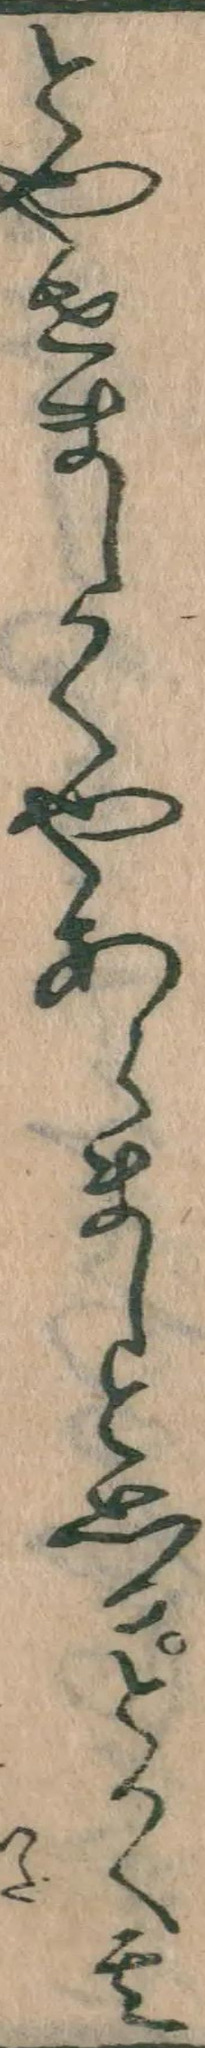とやせましくやあらましと思ひ。とかく其
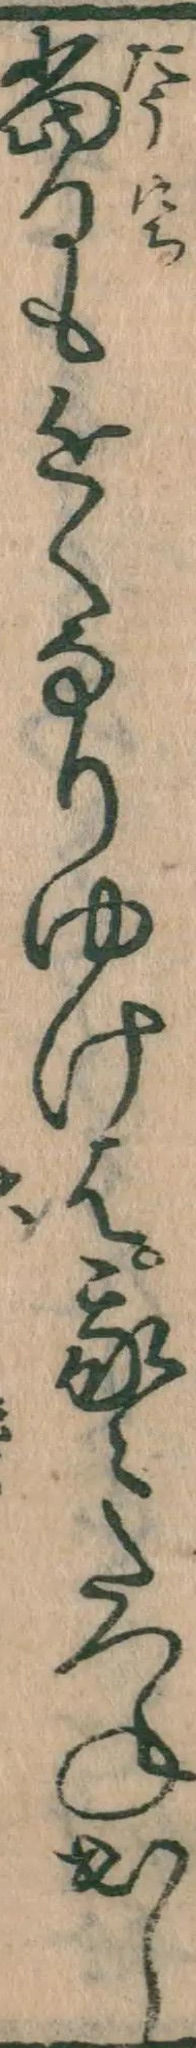当日も近くなりゆけは。我々たつね出し
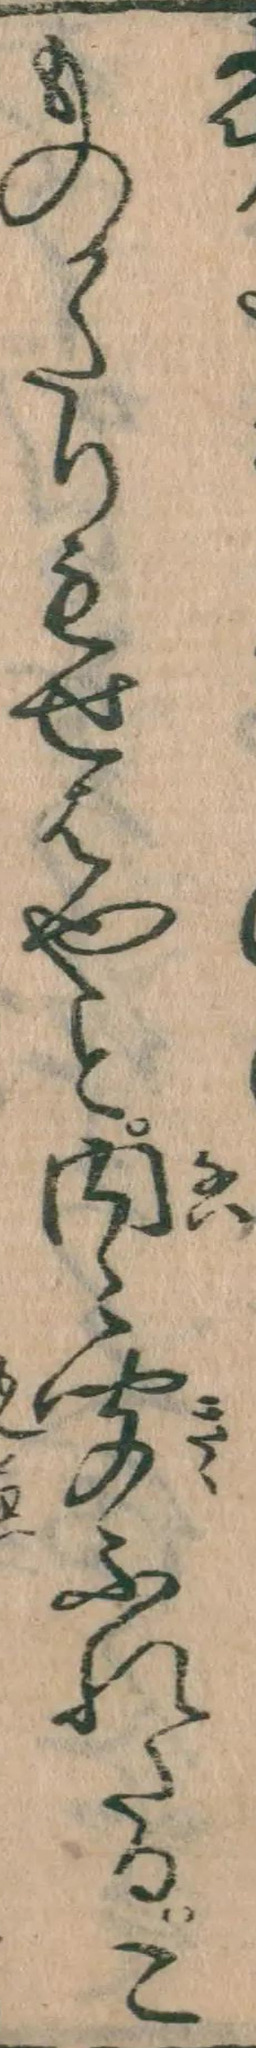ものかたりもせはやと。内々聞ふれたる。こ
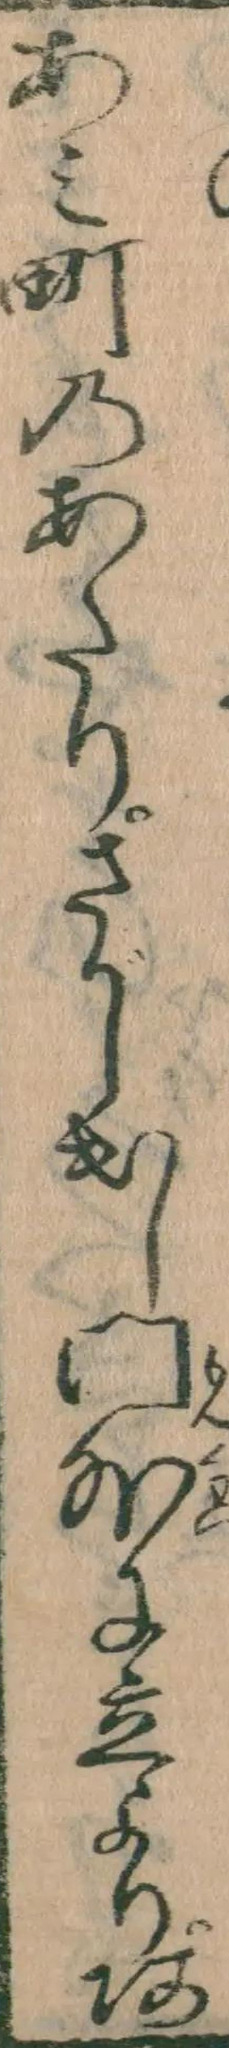あみ町のあたり。さがし出し門外に立より。あ

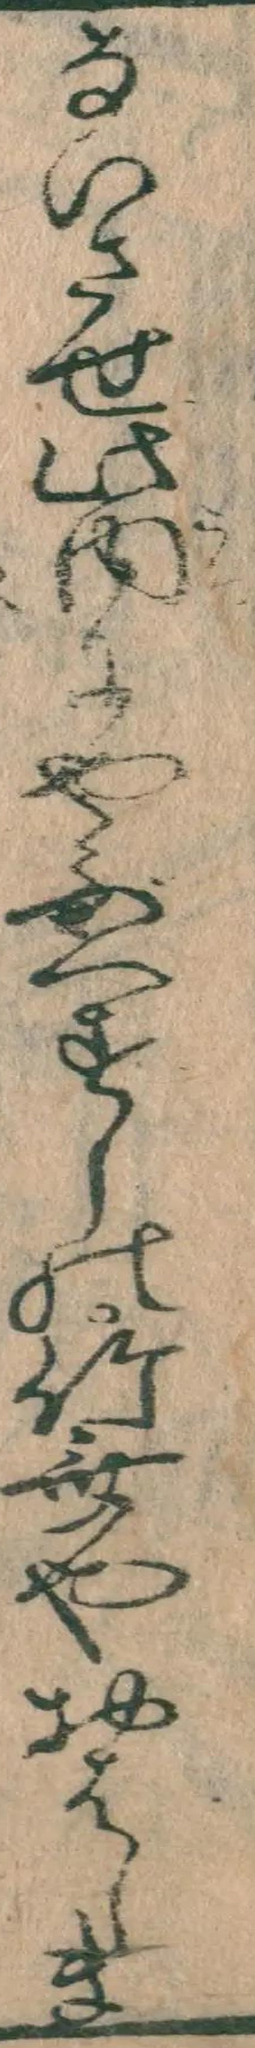ないさせ此内にやぶくすしの。竹斎やおはしま
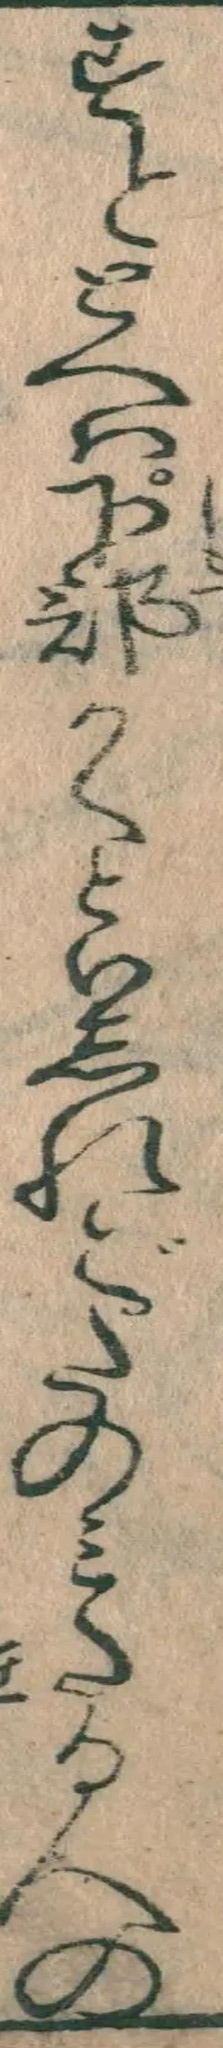すととへは。下部かくとはしれど。たのみたる人の
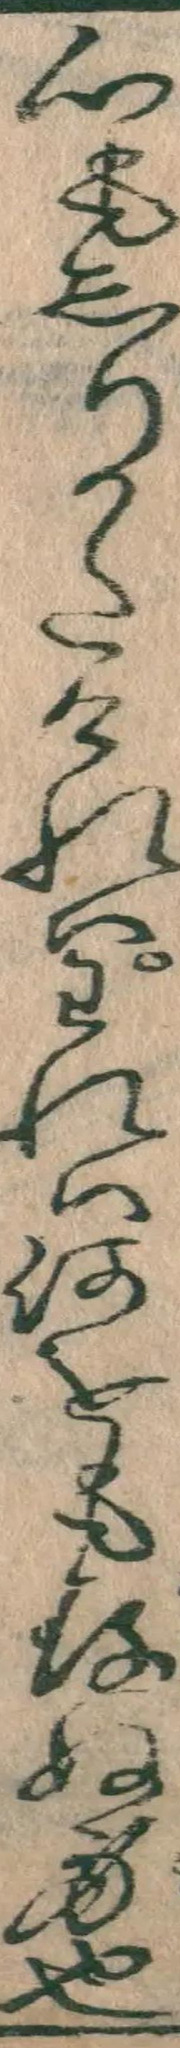心もしりかたけれは。われは何をも存ぬ身也
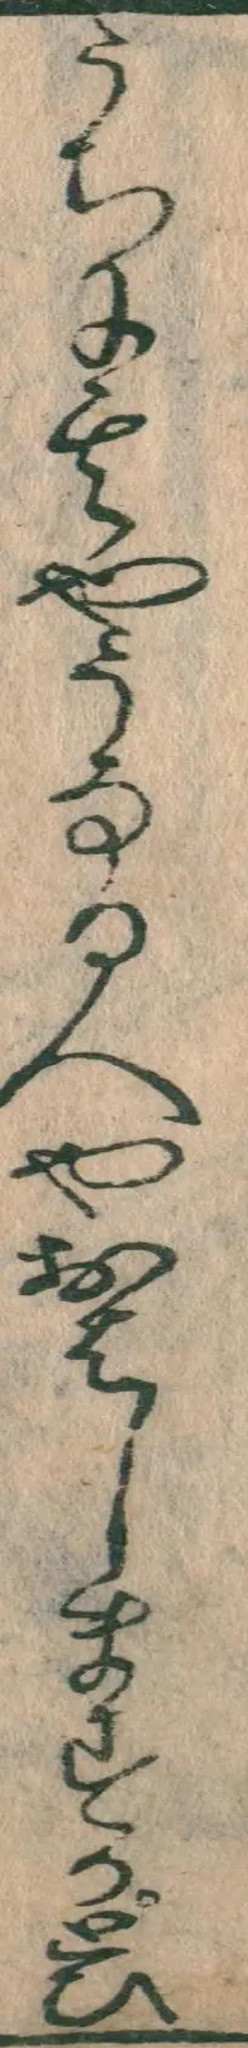うちに其やうなる人やおはしますか。とひ
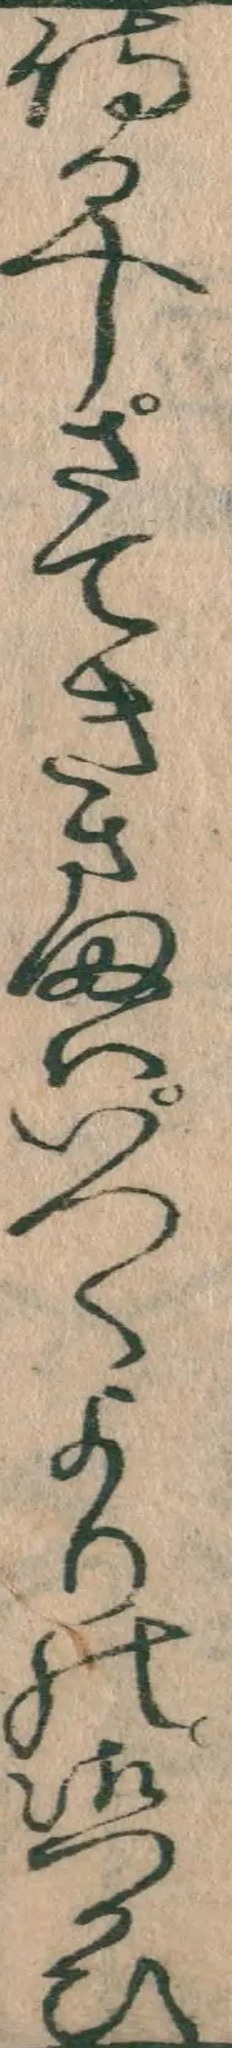侍るへし。さてきさまは。いつくよりの御つかひ
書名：竹斎狂歌物語 3巻
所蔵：国立国会図書館 National Diet Library, JAPAN
